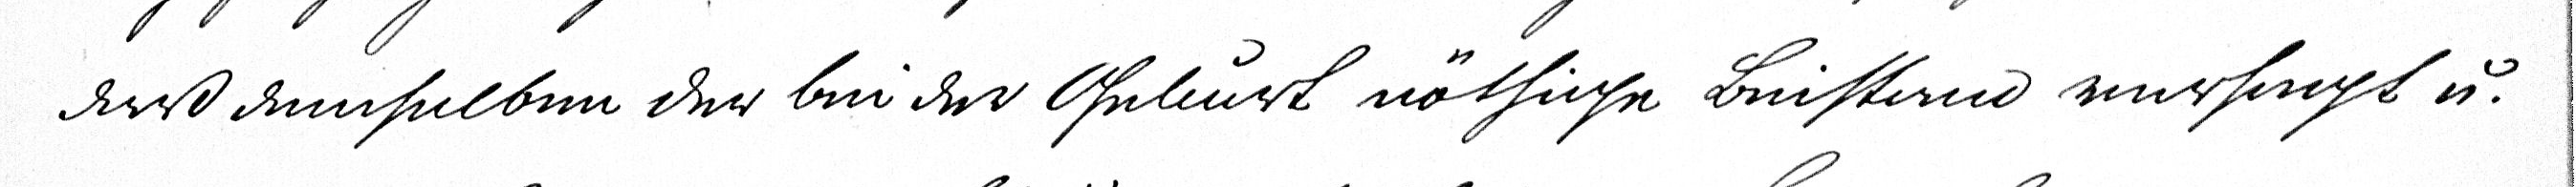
daß demselben der bei der Geburt nöthige Beistand versagt u.
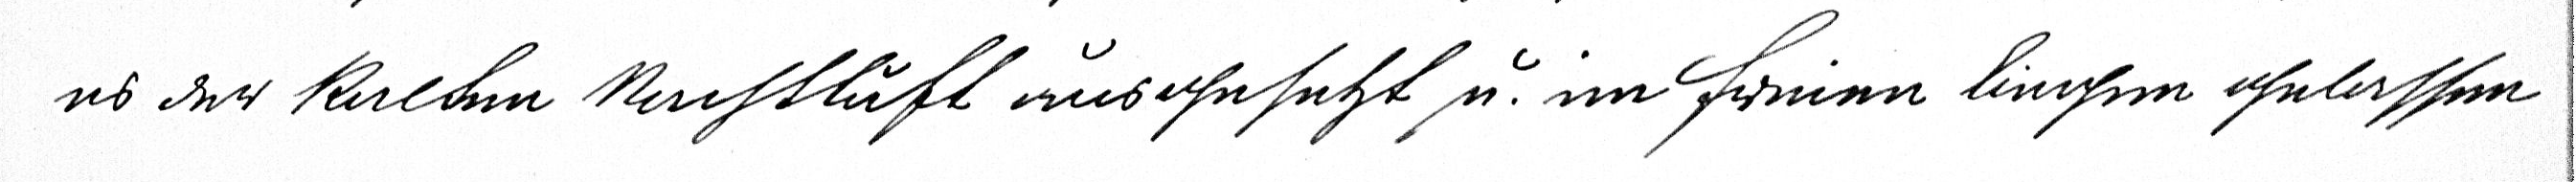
es der kalten Nachtluft ausgesetzt u. im Freien liegen gelassen
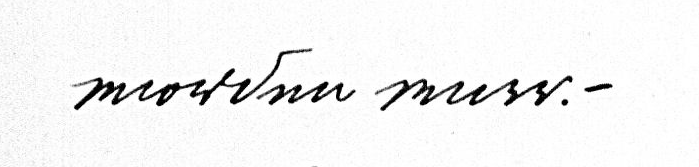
worden war.-
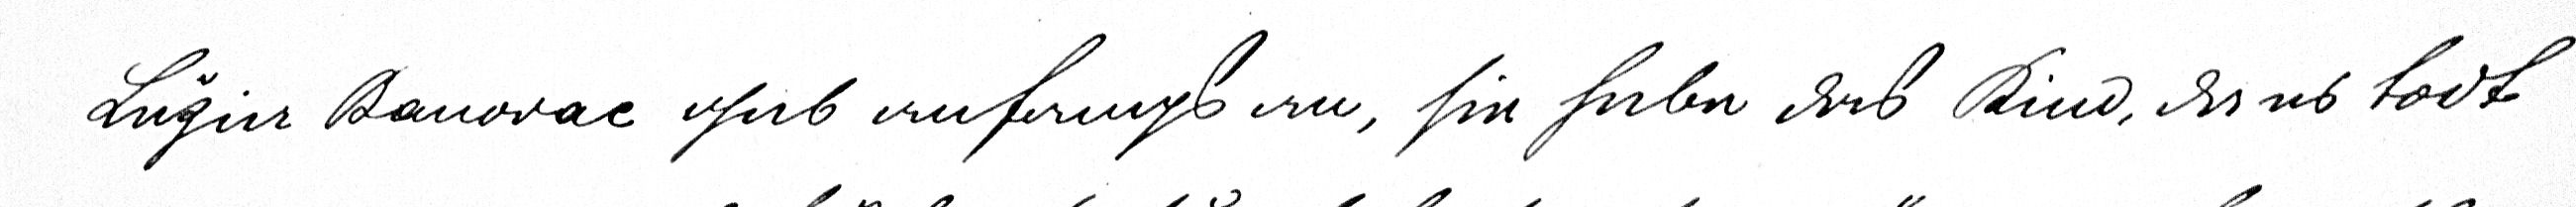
Luzia Banovac gab anfangs an, sie habe das Kind, da es todt
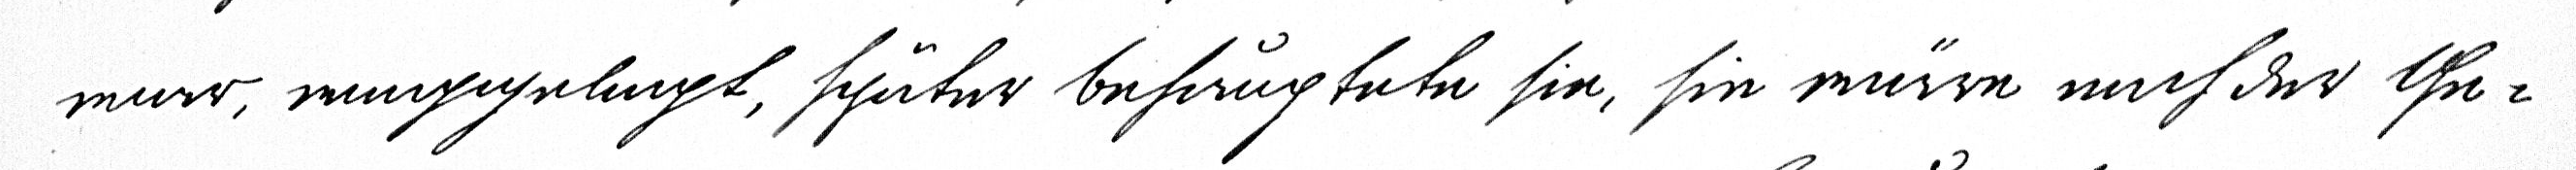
war, weggelegt, später behauptete sie, sie wäre nach der Ge¬
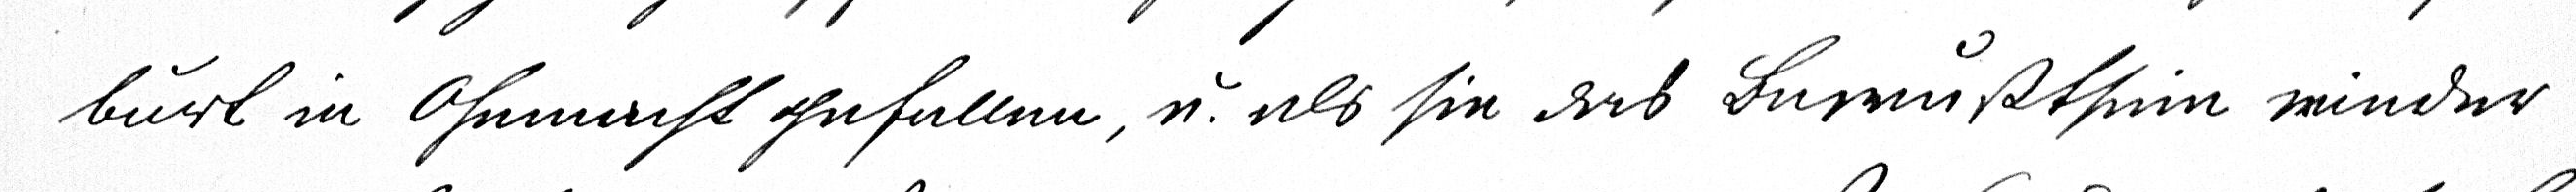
burt in Gemacht gefallen, u. als sie das Bewußtsein wieder
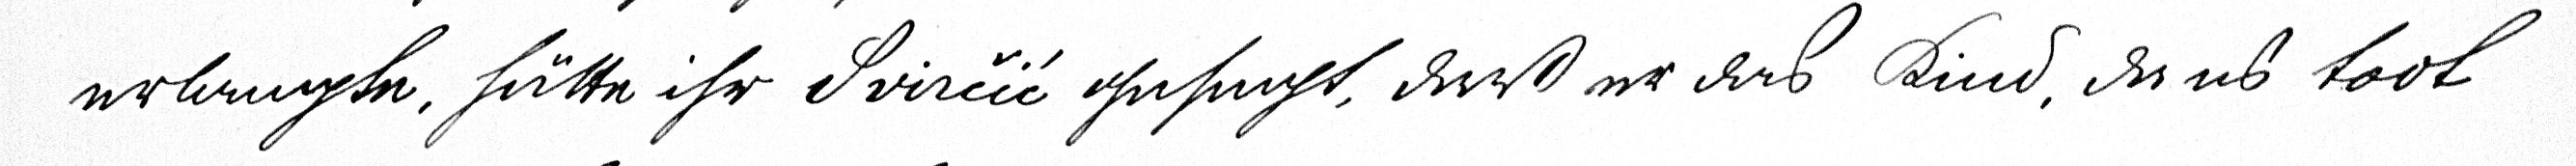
erlangte, hätte ihr Svirčić gesagt, daß er das Kind, da es todt
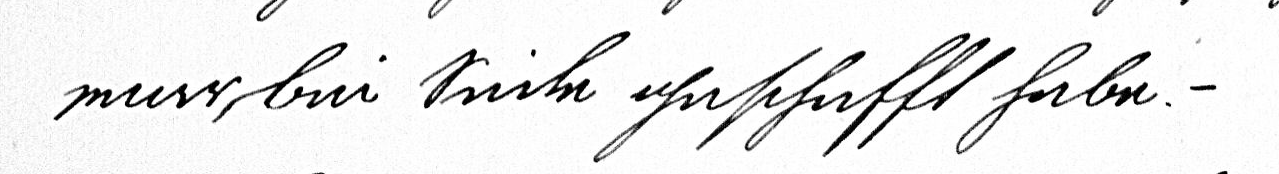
war, bei Seite geschafft habe.-
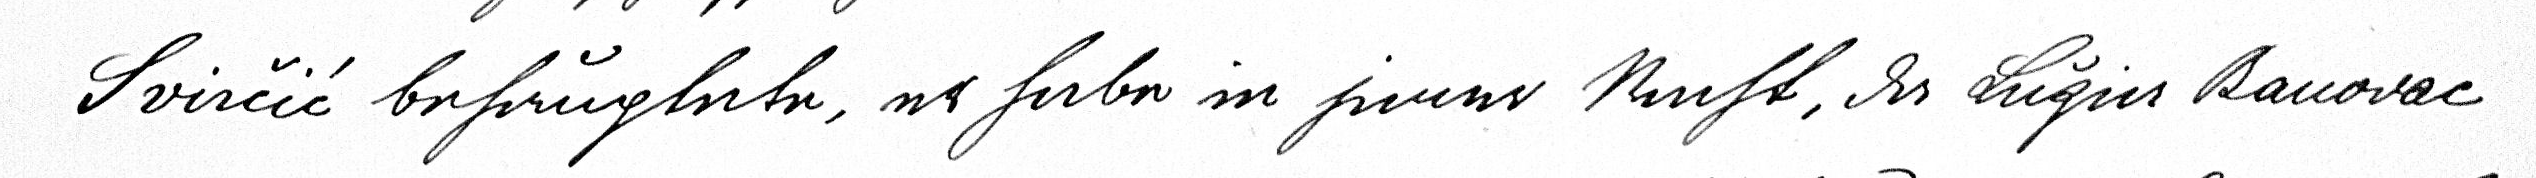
Svirčić behauptete, er habe in jener Nacht, da Luzia Banovac
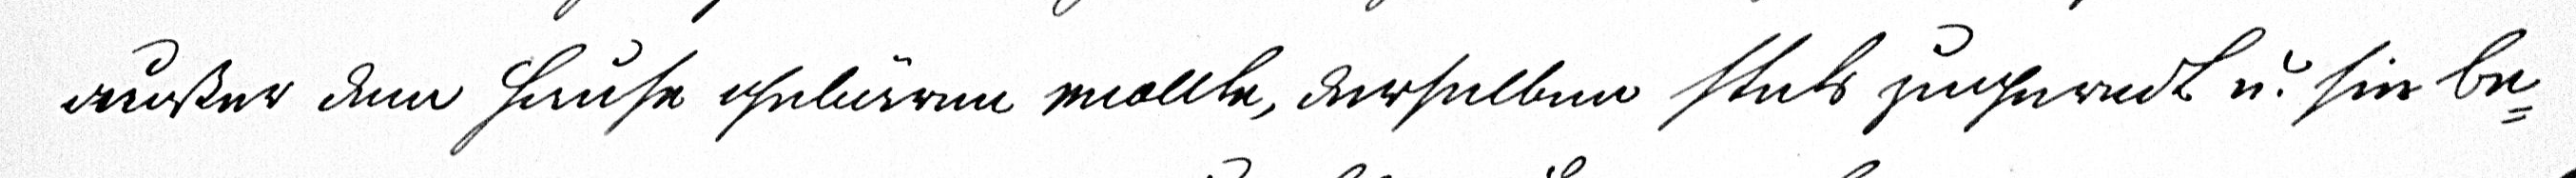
außer dem Hause gebären wollte, derselben stats zugeredt u. sie be¬
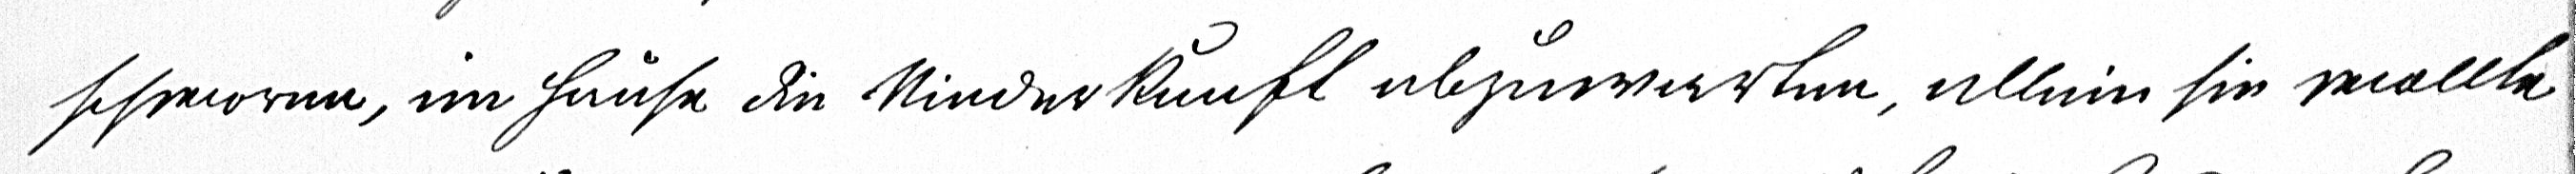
schworen, im Hause die Niederkunft abzuwarten, allein sie wollte
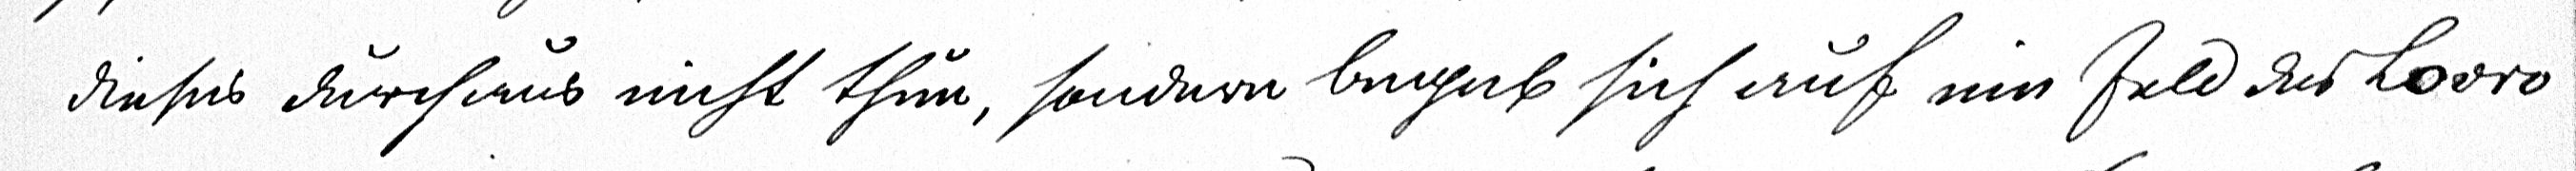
dieses durch aus nicht thun, sondern begab sich auf ein Feld des des Lovro
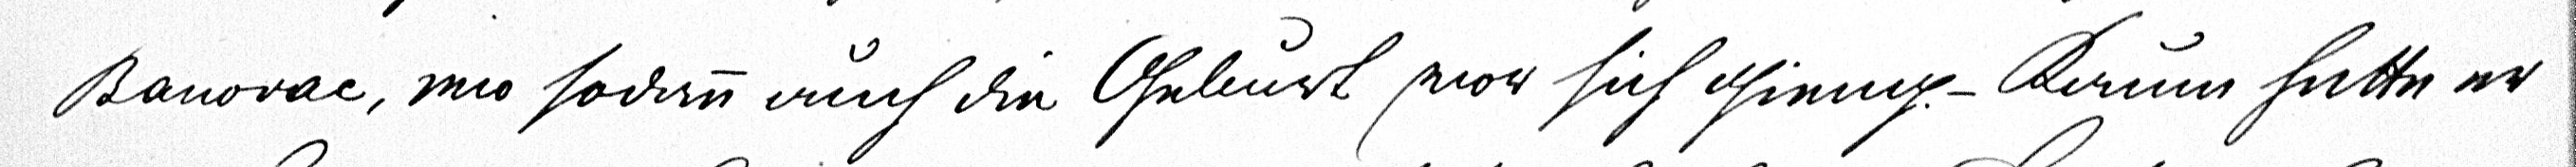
Banovac, wo sodann auch die Geburt vor sich Gieng.- Kaum hatte er
